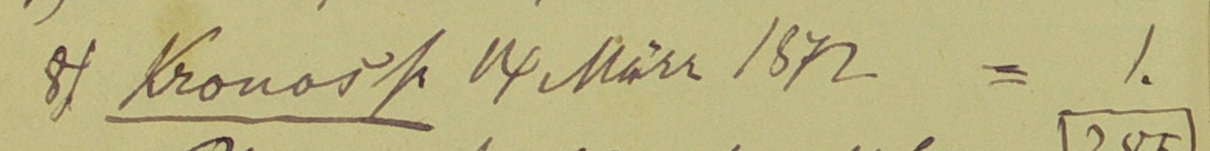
8) Kronoche seit 14 März 1872 = 1
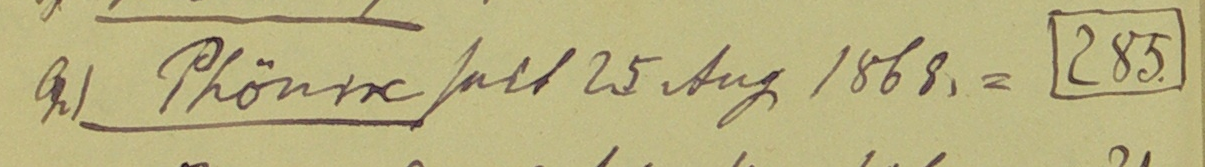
9) Phönix seit 14 März 1872 = 285
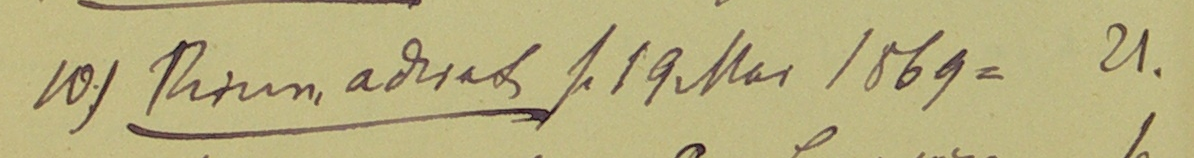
10) Riunion. Adriatica seit 19 März 1869 = 21
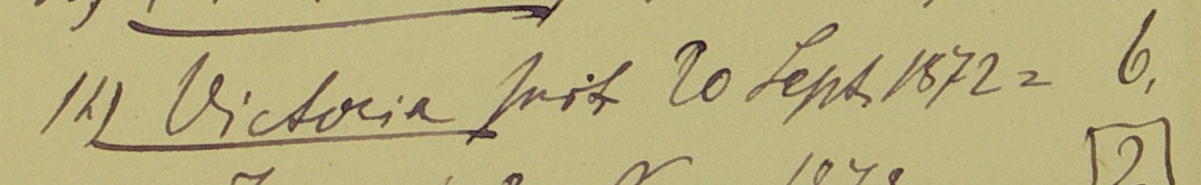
11) Victoria seit 20 Sept. 1872 = 6
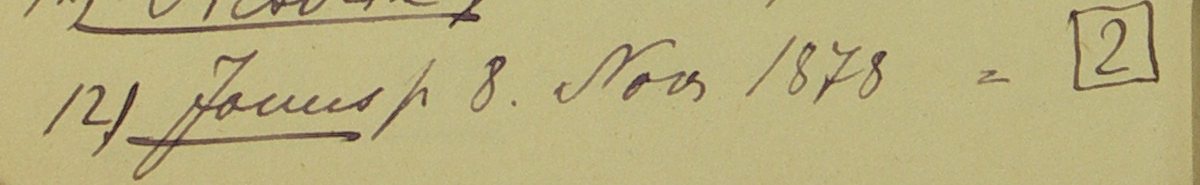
12) Janus seit Nov. 1878 = 2
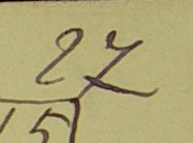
27
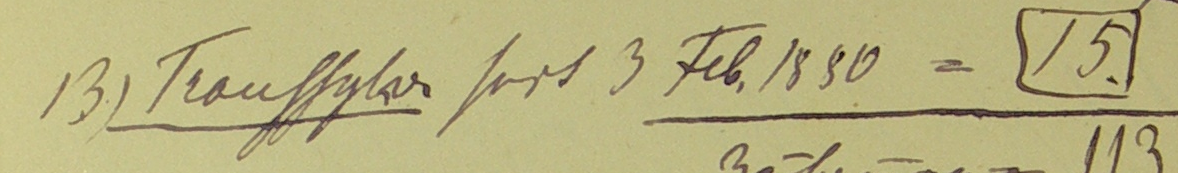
13) Transylvania seit 3 Febr. 1880 = 15
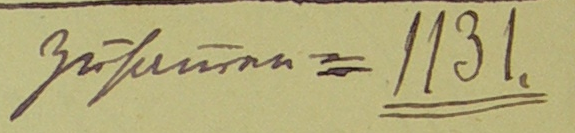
Zusammen = 1131
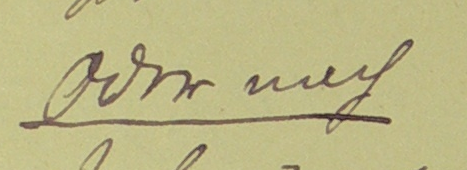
Oder nach
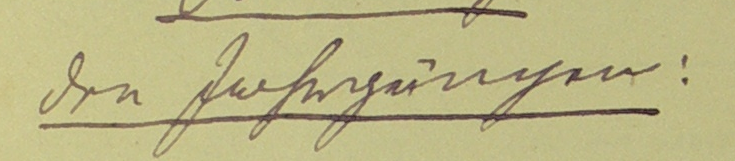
Jahrgängen:
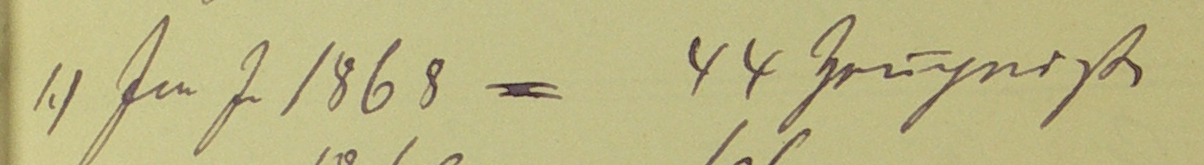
1) Im Jahre 1868 = 44 Zeugniße
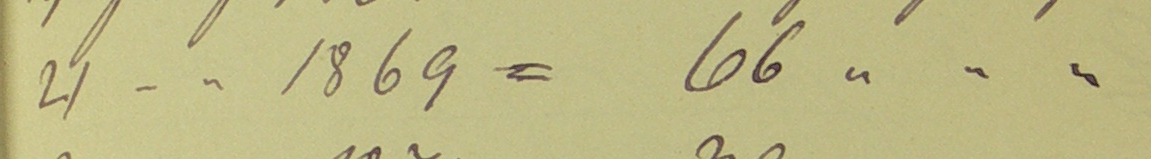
2) * 1869 = 66 *
